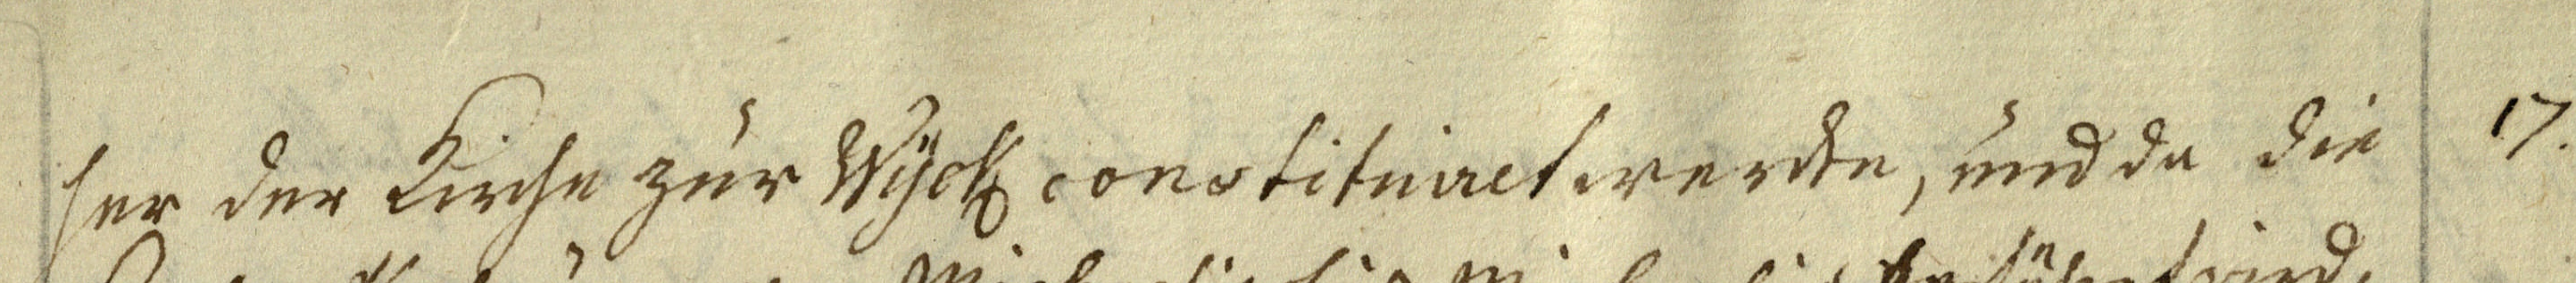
her der Kirche zur Wÿck constituiret werden, und da die
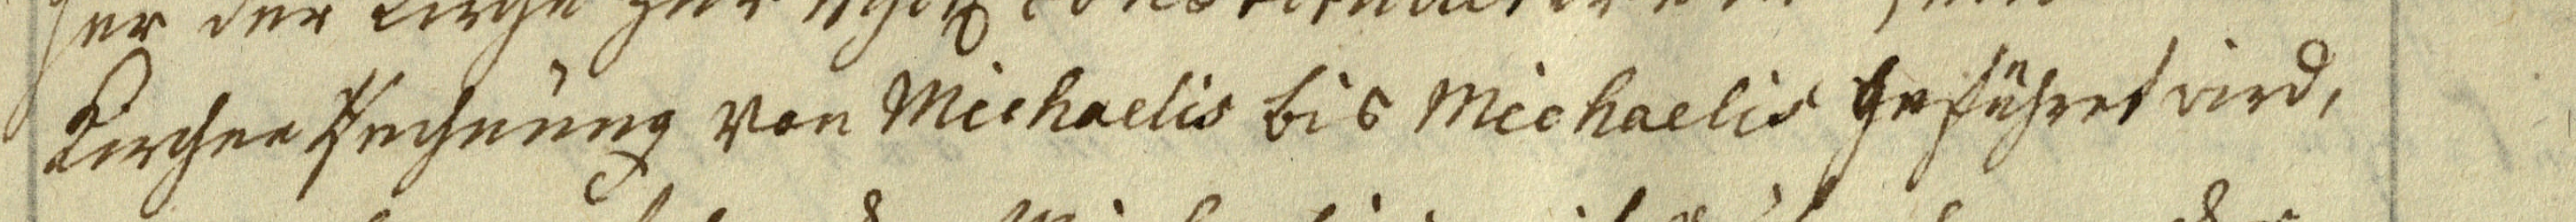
Kirchen Rechnung von Michaelis bis Michaelis geführet wird,
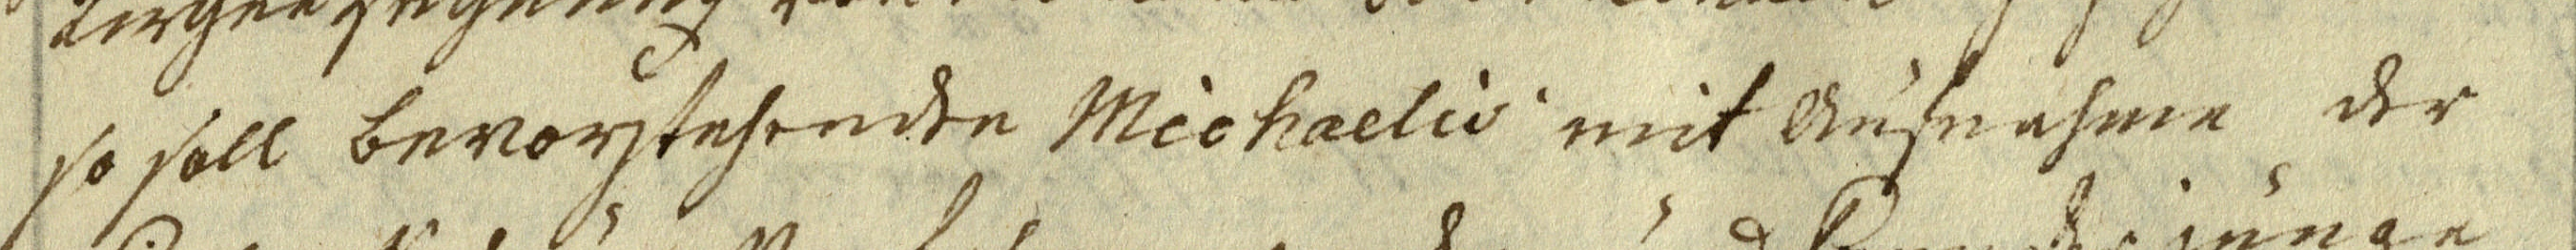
so soll bevorstehenden Michaelis mit Aufnahme der
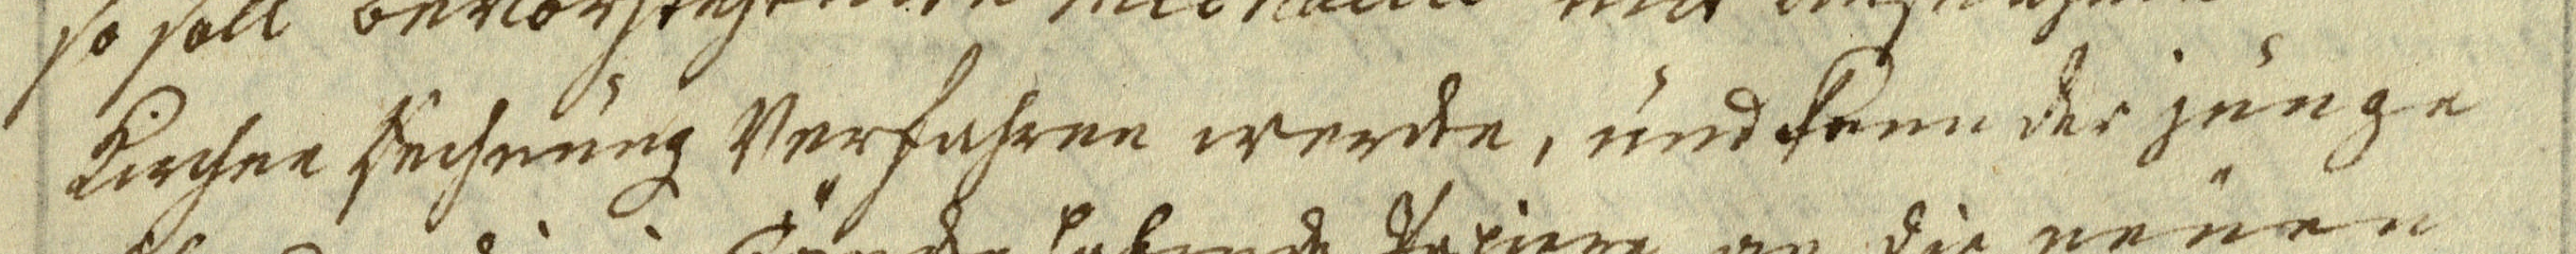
Kirchen Rechnung verfahren werden, und kann der junge
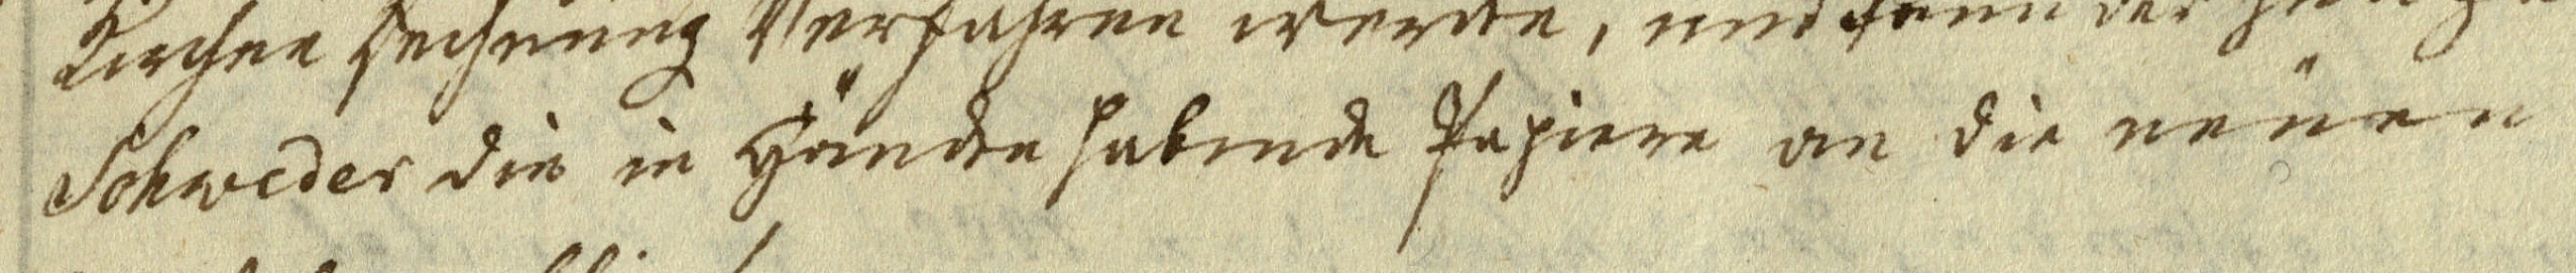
Schweder die in Händen habende Papiere an die neuen
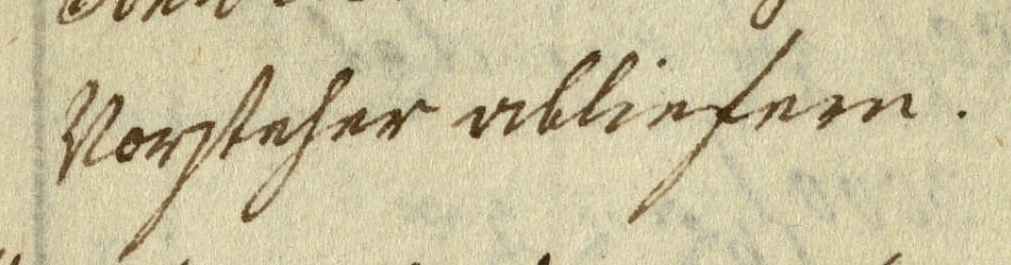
Vorsteher abliefern.
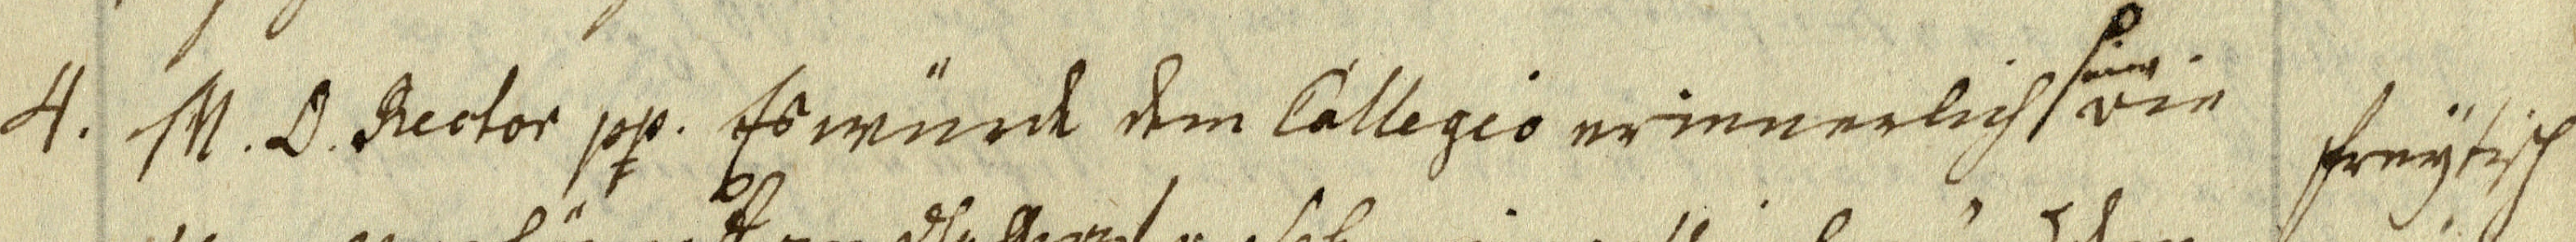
4. M. D. Rector pp. Es würde dem Collegio erinnerlich sein wie freÿtisch
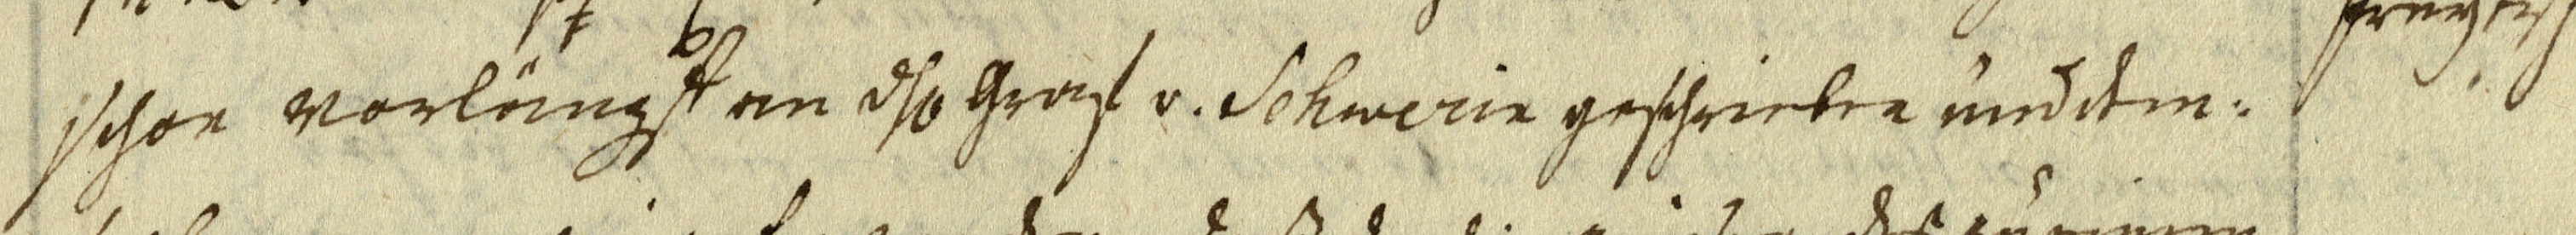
schon vorlängst an dh Graf v. Schwerin geschrieben und dem¬
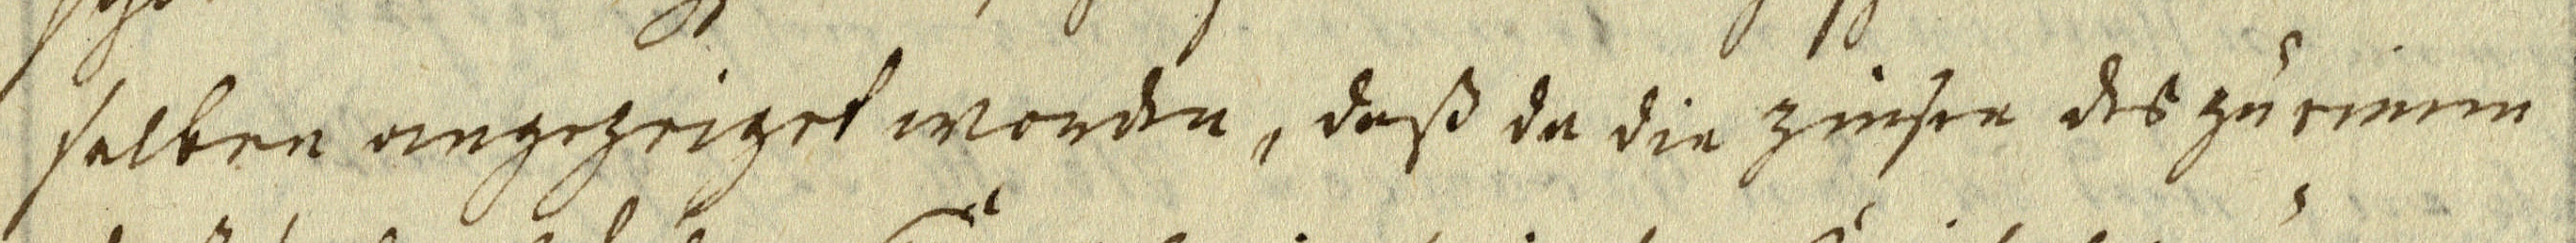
selben angezeiget, worden, daß da die Zinsen der zu einem
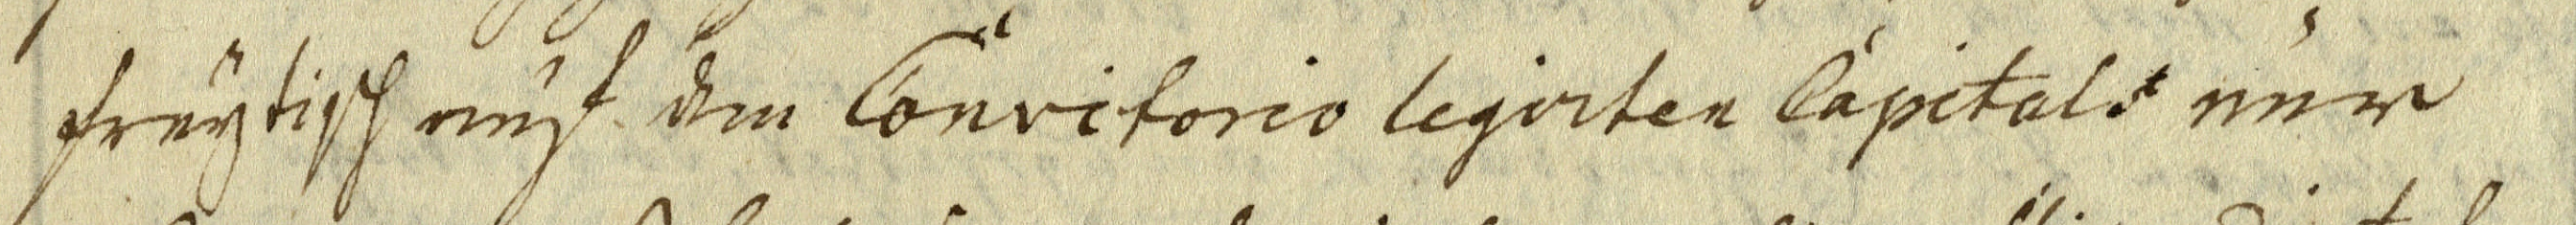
freÿtisch auf dem Convictorio legirten Capitals nur
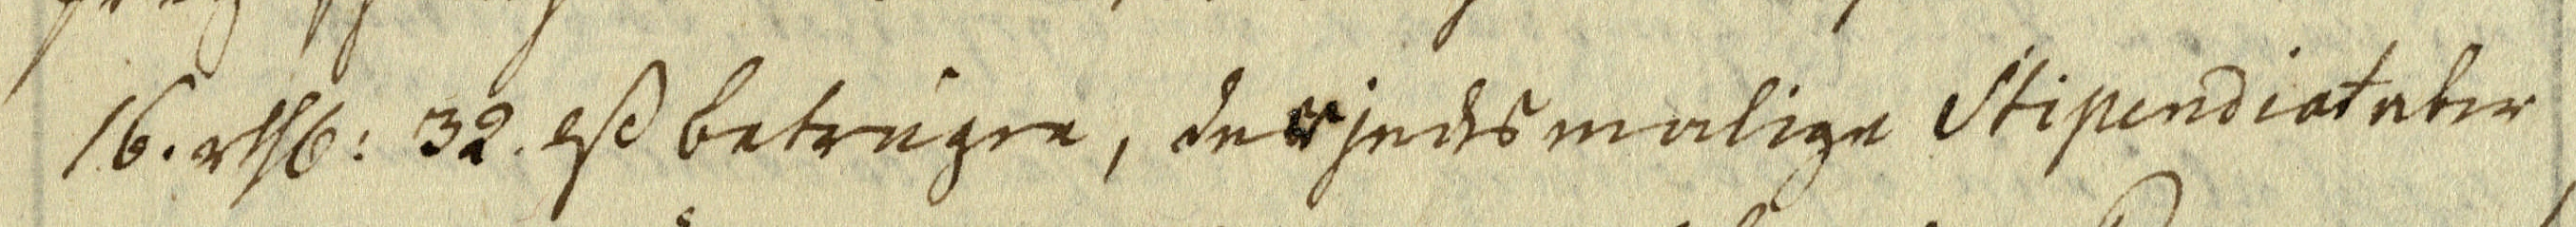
16.rtl. 32. s. betrugen, der jedesmalige Stipendiat aber
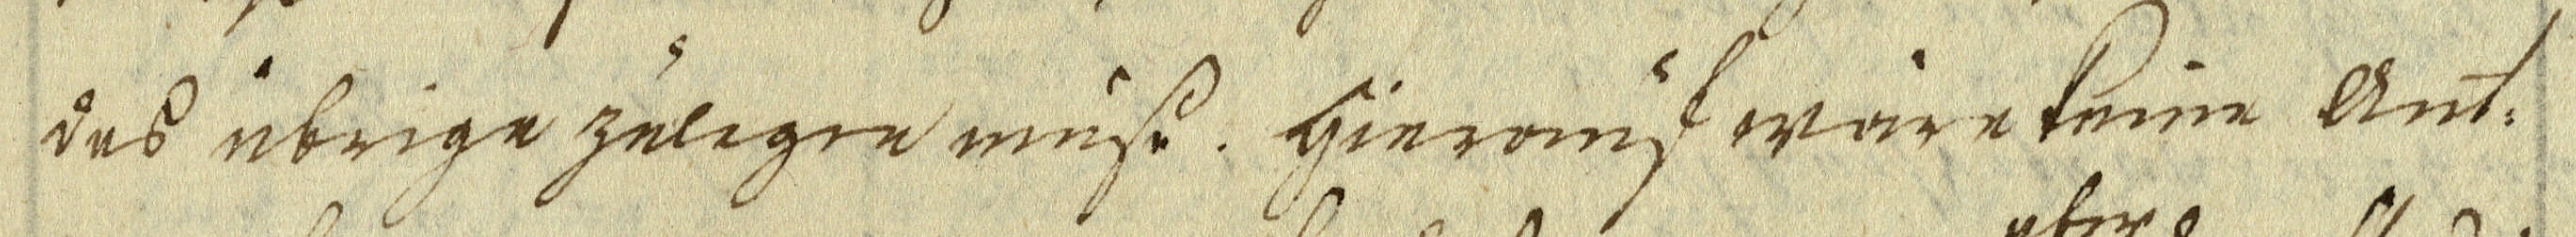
das übrige zulegen müße. Hierauf wäre keine Ant¬
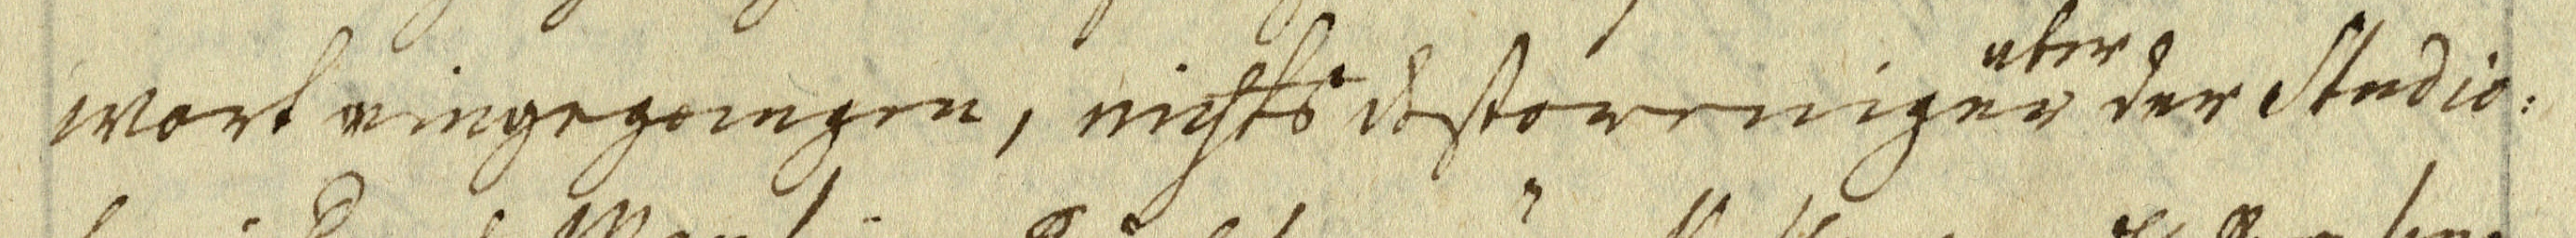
wort eingegangen, nichts destoweniger aber der Studio¬
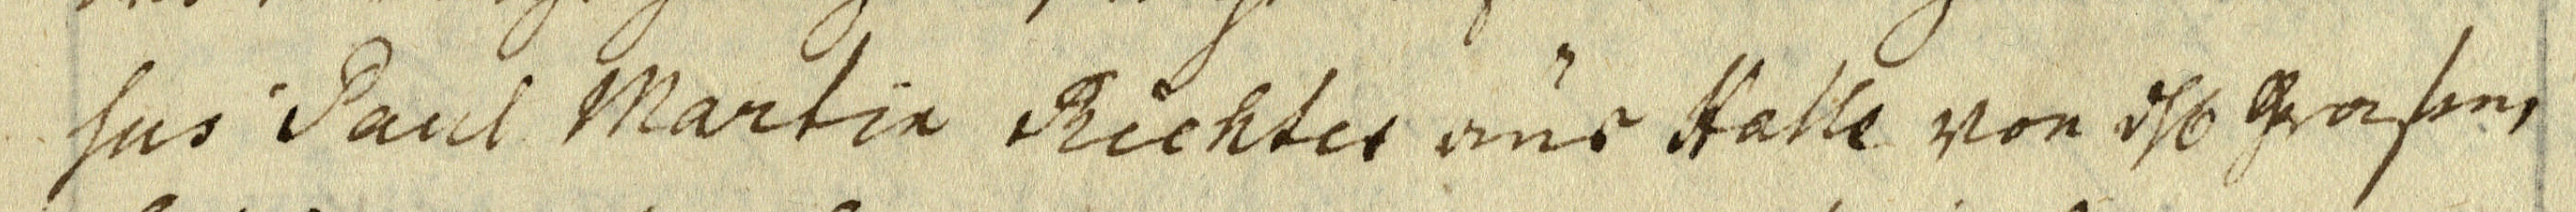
sus Paul Martin Richter aus Halle von dh Grafen,
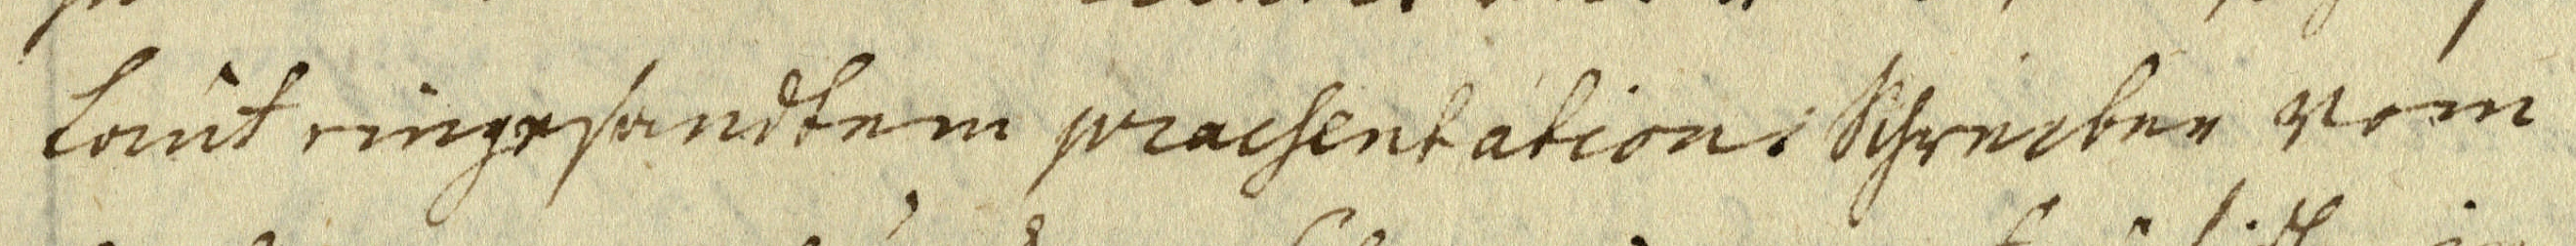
laut eingesandtem praesentations Schreiben vom
